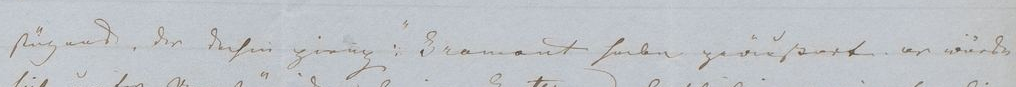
stüzend, der dahin gieng: «Gramont habe geäußert – er würde
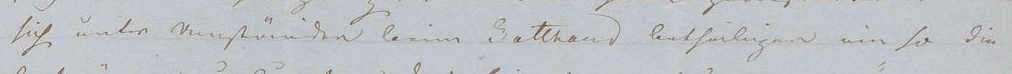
sich unter Umständen beim Gotthard betheiligen um so die
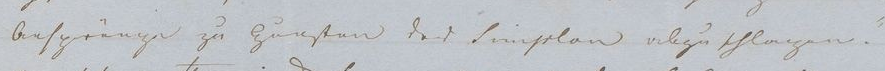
Ansprünge zu Gunsten des Simplon abzuschlagen.» –
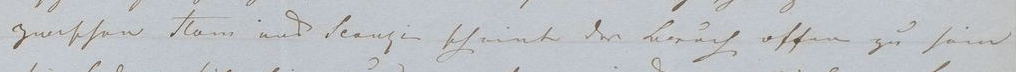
Zwischen Stamm und Scanzi scheint der Bruch offen zu sein
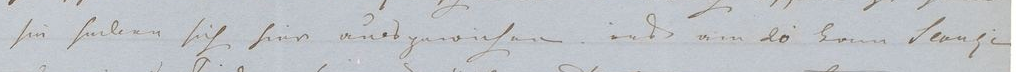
sie haben sich hier ausgewichen und am 20t kam Scanzi
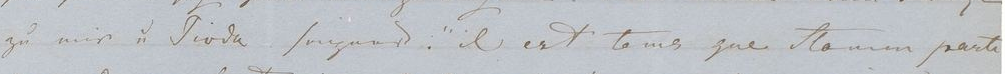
zu mir u Pioda sagend: «il est tems que Stamm parte
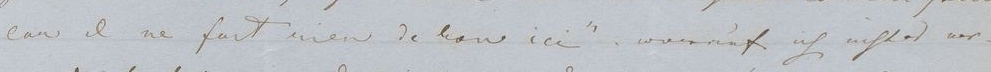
car il ne fait rien de bon ici» – worauf ich nichts er-
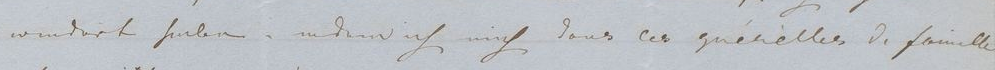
wiedert habe – indem ich mich dans ces quérèlles de famille
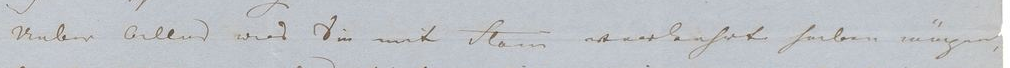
Ueber Alles was Sie mit Stamm verkehrt haben mögen,
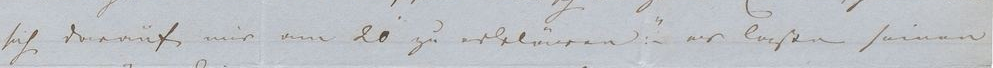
sich darauf mir am 20t zu erklären: «– er laße seinen
